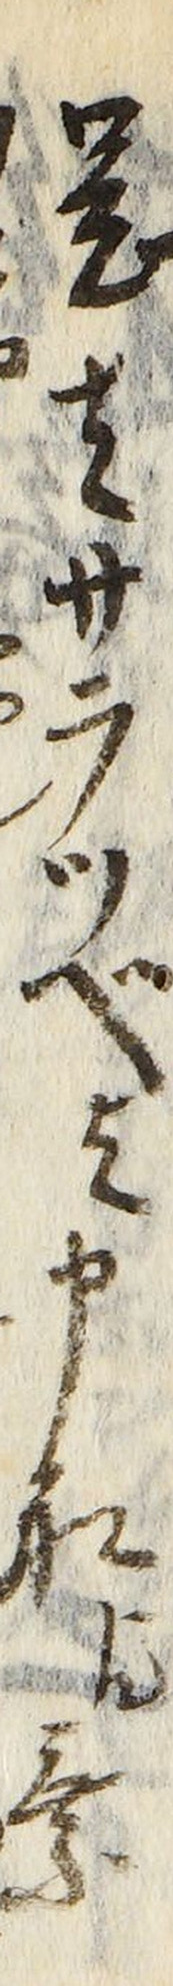是者サラツベと申舩江乗
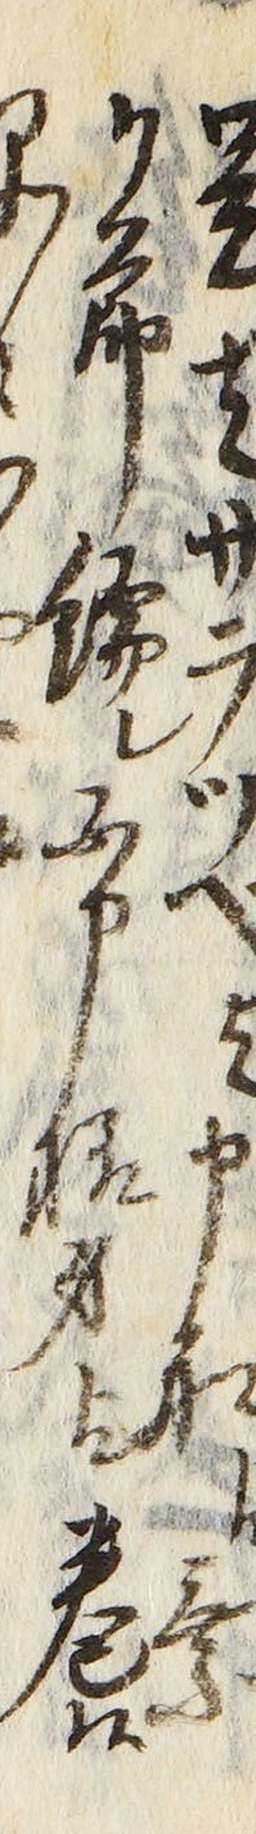候節濡レ不申様身え巻候
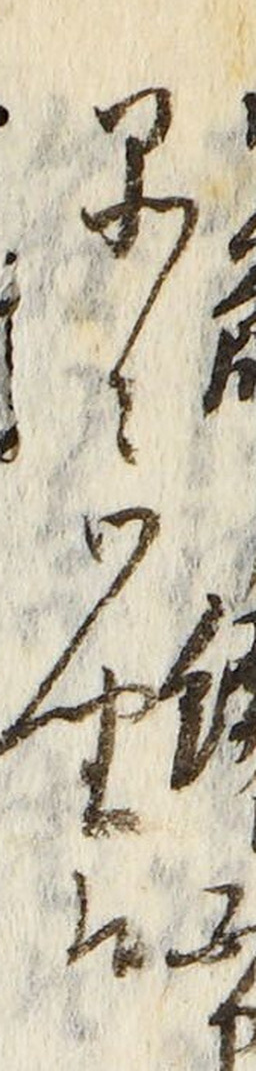品ニ御座候
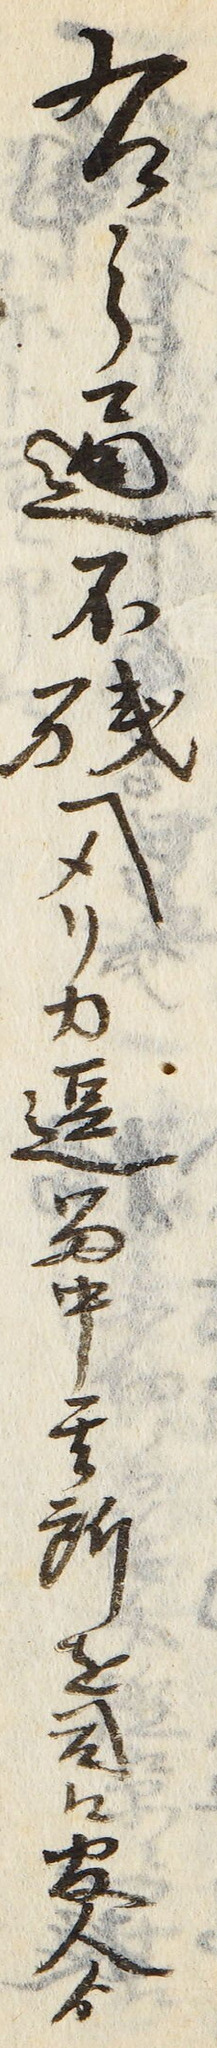右之通不残「メリカ逗留中其所を司候官人ゟ
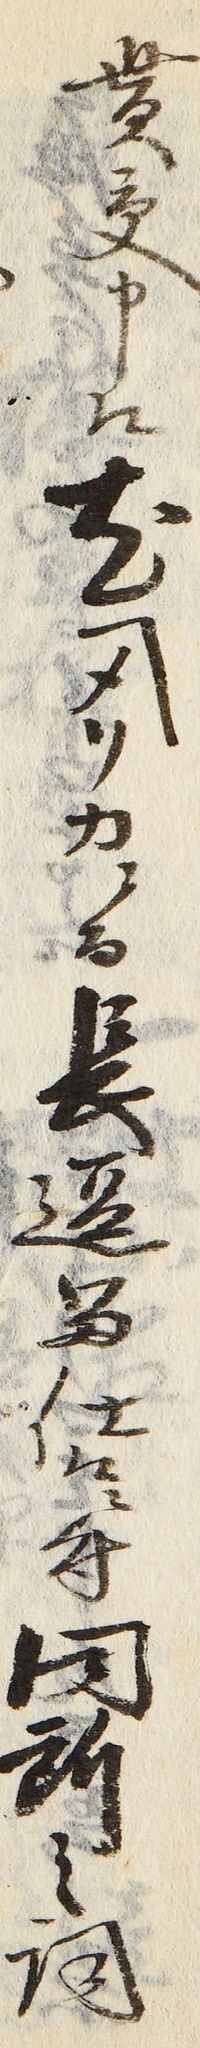貰受申候尤「メリカニ而長逗留仕候ニ付同所之詞
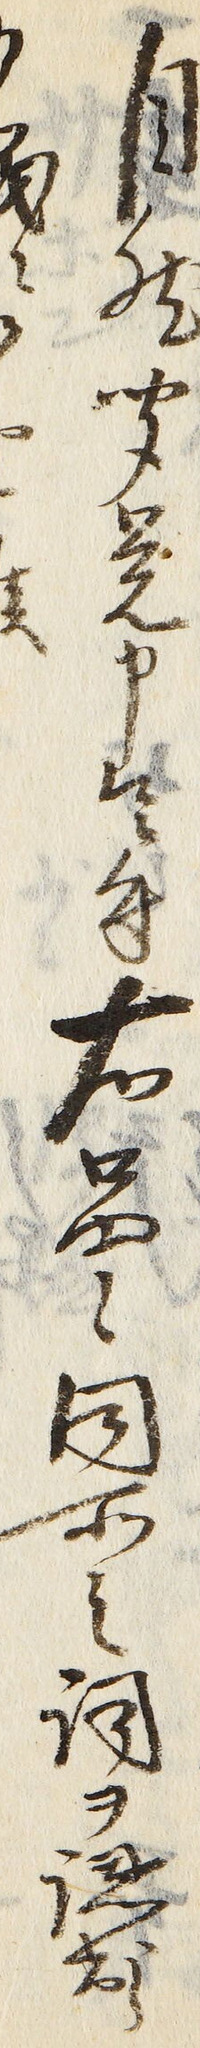自然聞覚申候ニ付右品之同所之詞ヲ認出し
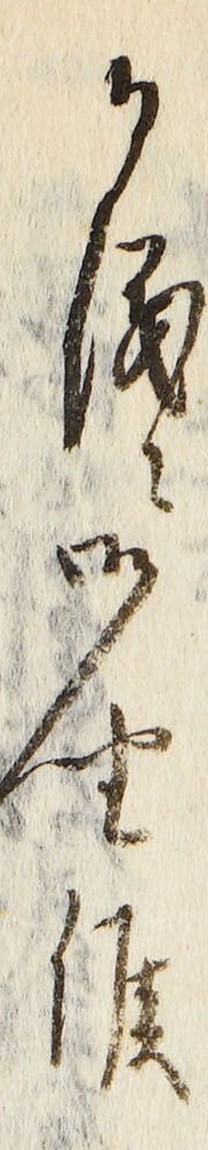候儀ニ御座候

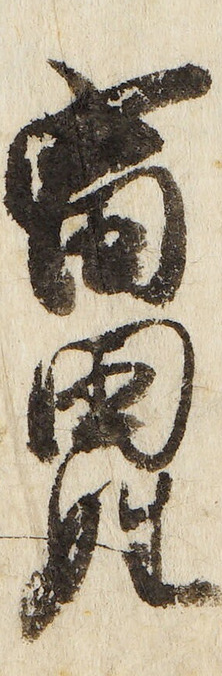富田姓
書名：漂流人善助聞書
